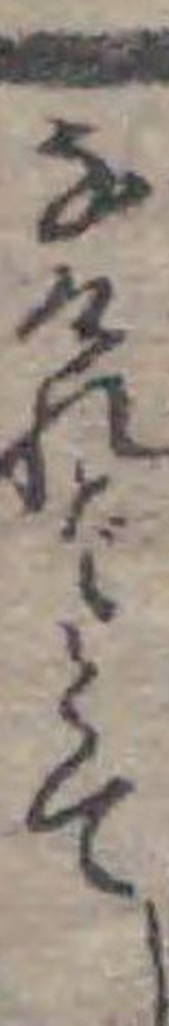なければとて
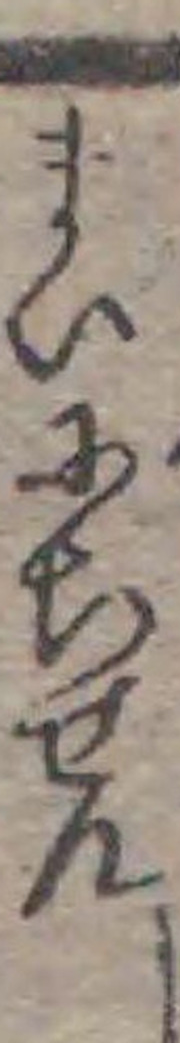まいにちせん
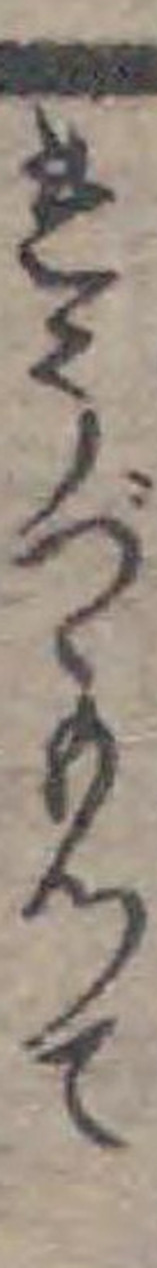れうづゝもつて
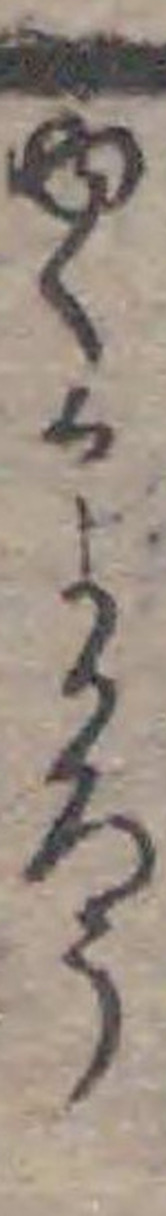ゆくかよかろう
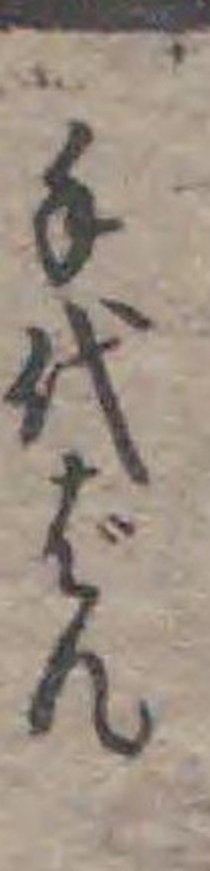手代ばん
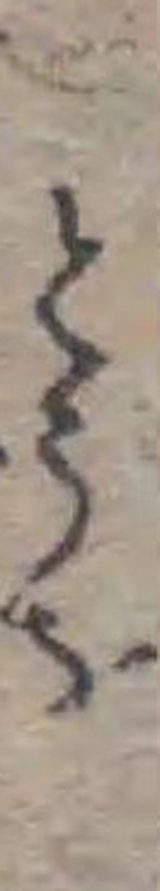とうを
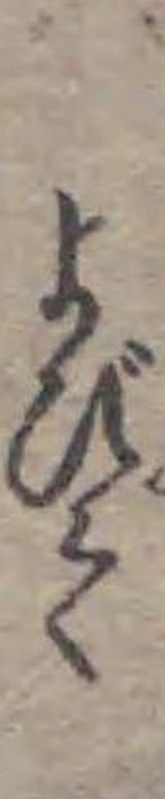よびて
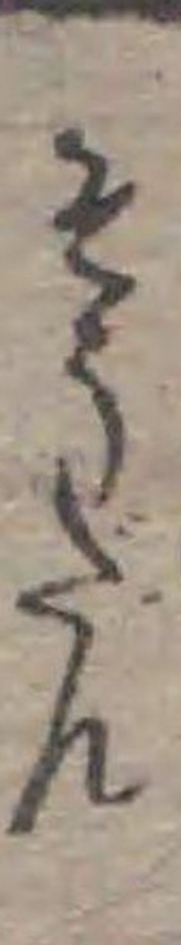そうだん
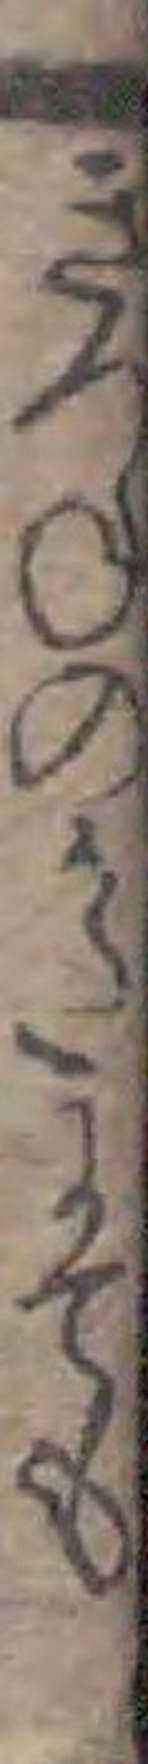きつねのかたにても
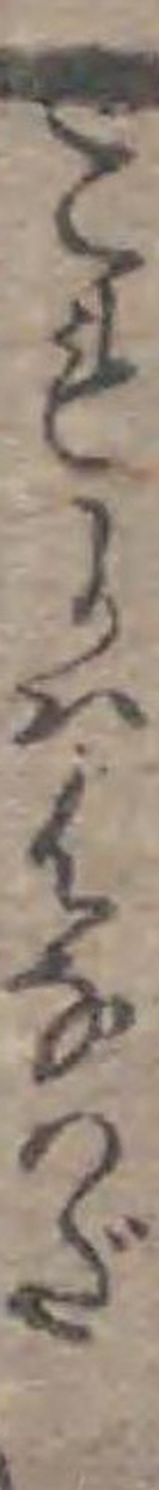これにははなはだ
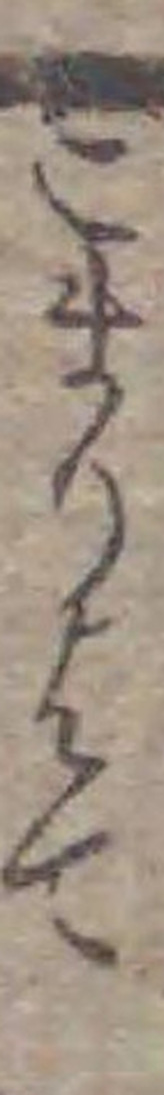こまりはて
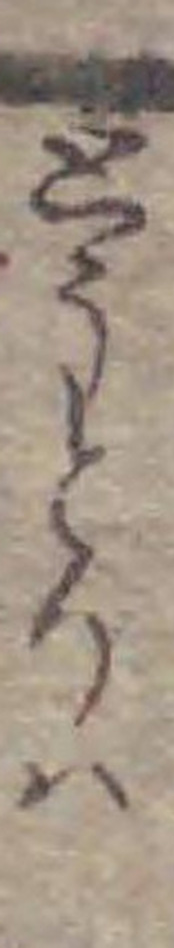とうとりは
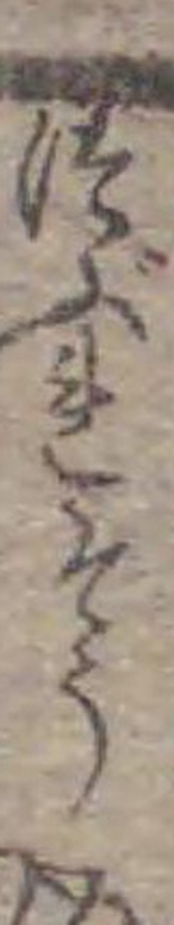つぶれそう
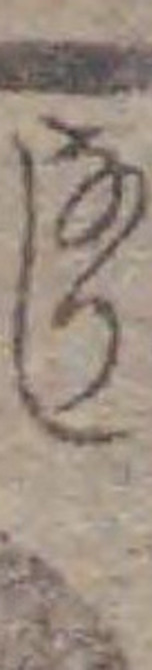なりし
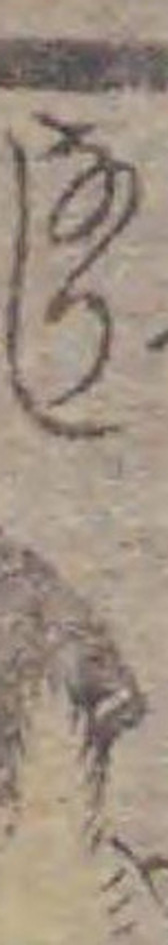なりし
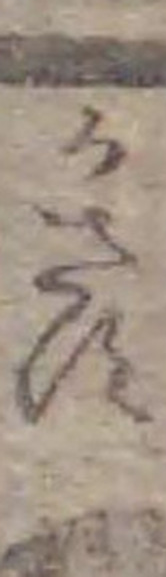かさす
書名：紺屋百物語 : 3巻
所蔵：国立国会図書館 National Diet Library, JAPAN
